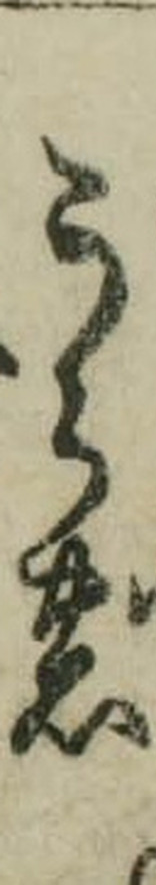うらの
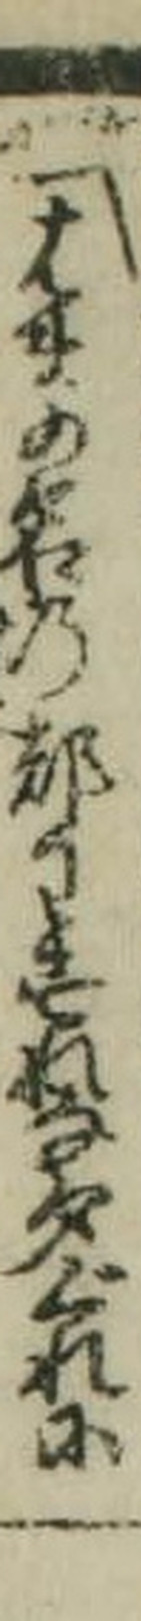〽はまの名の都わすれな夕ぐれに
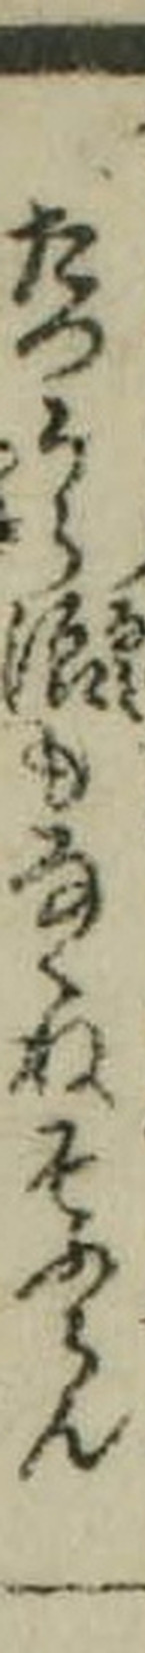たつうら浪もなくねそふらん
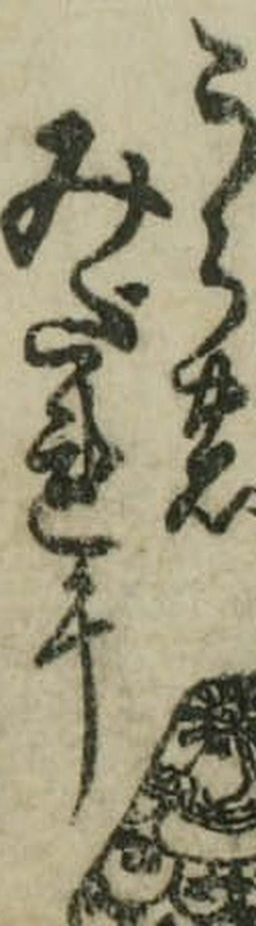みだれに
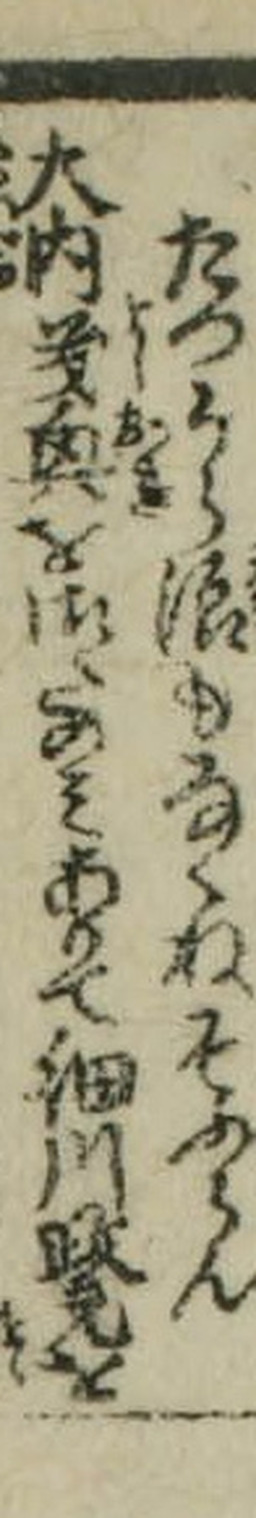大内義興を御たのみありて細川政元を
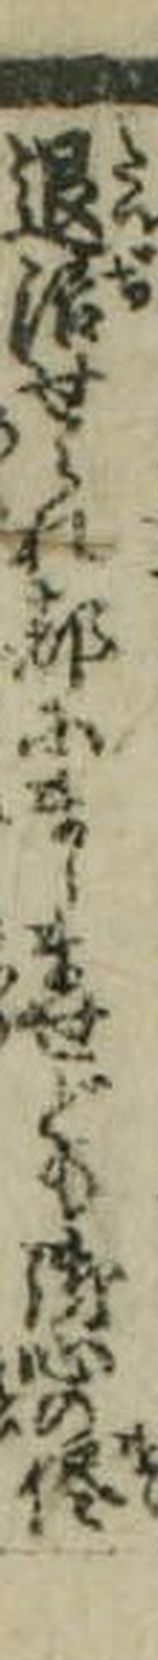退治せられ都にましませども御心の儘
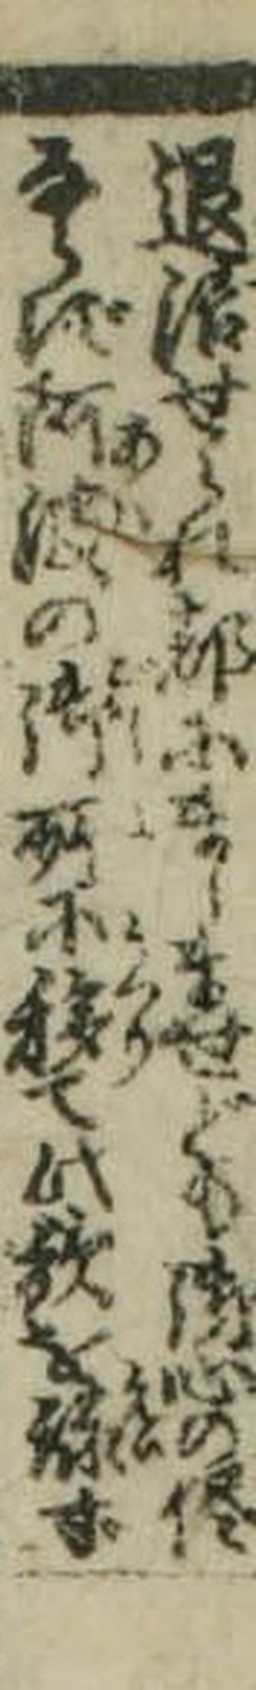ならず阿波の御所に移て此歌を詠ず
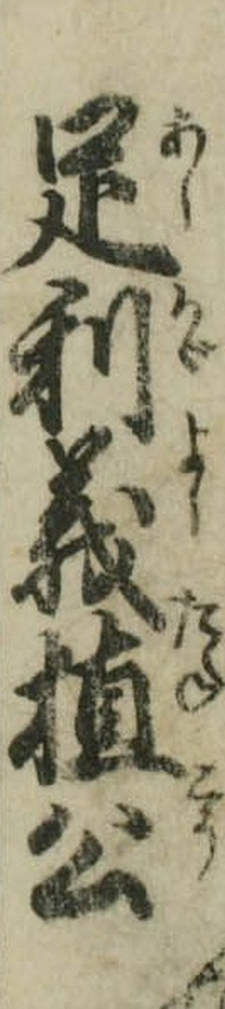足利義植公
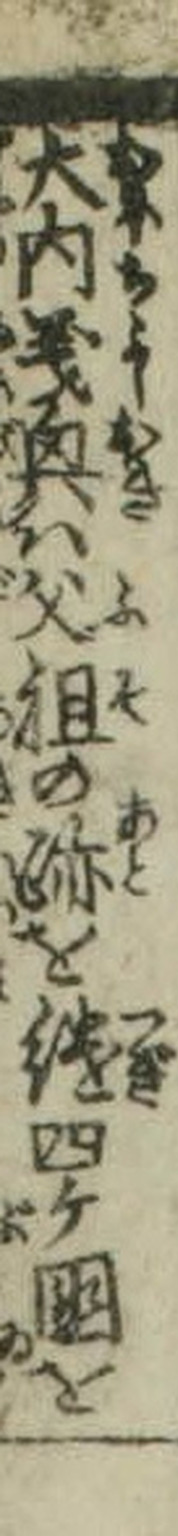大内義興は父祖の跡を継四ヶ国を
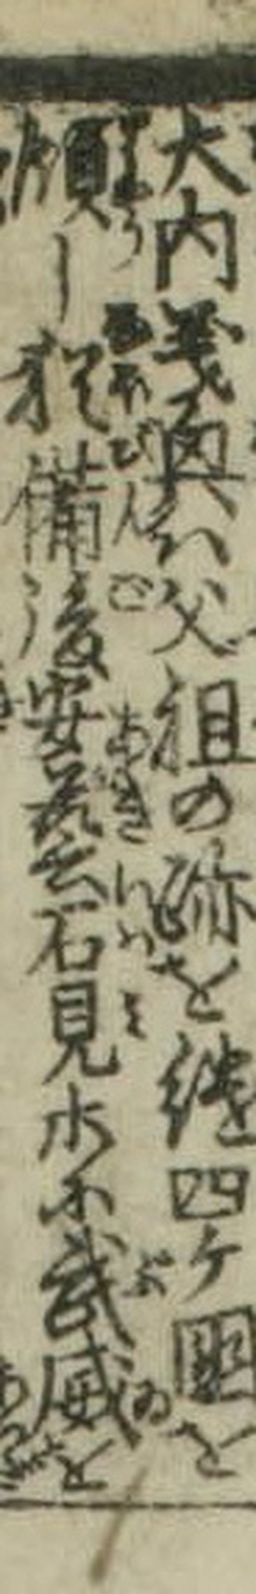領し猶備後安芸石見等に武威を
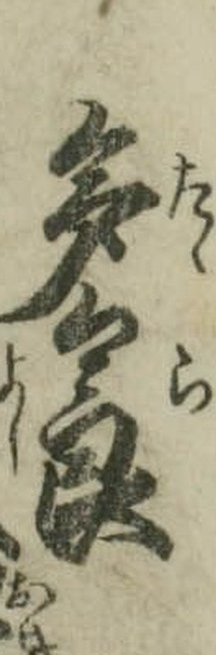多々良
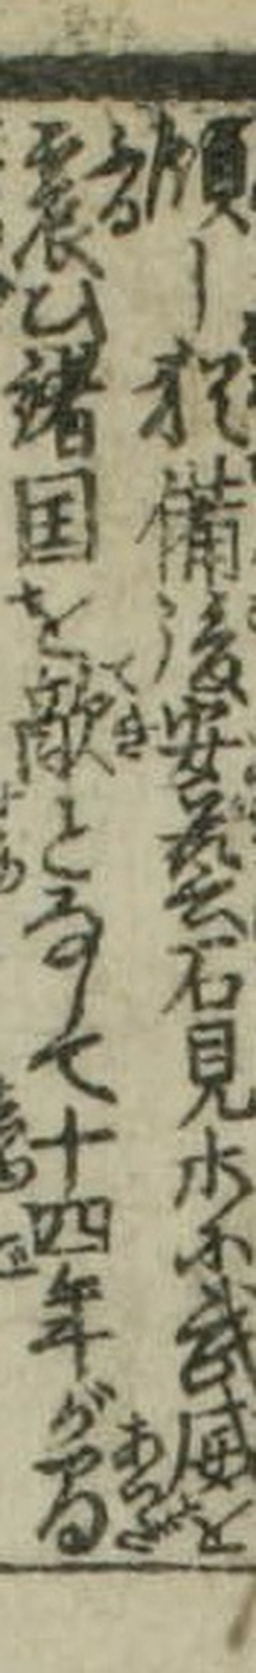震ひ諸国を敵となして十四年が間
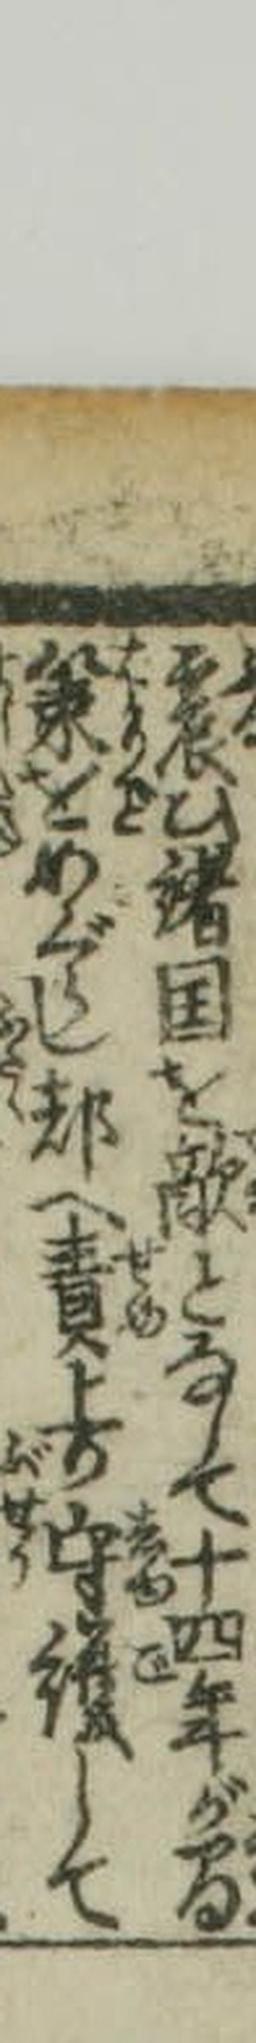策をめぐらし都へ責上り守護して
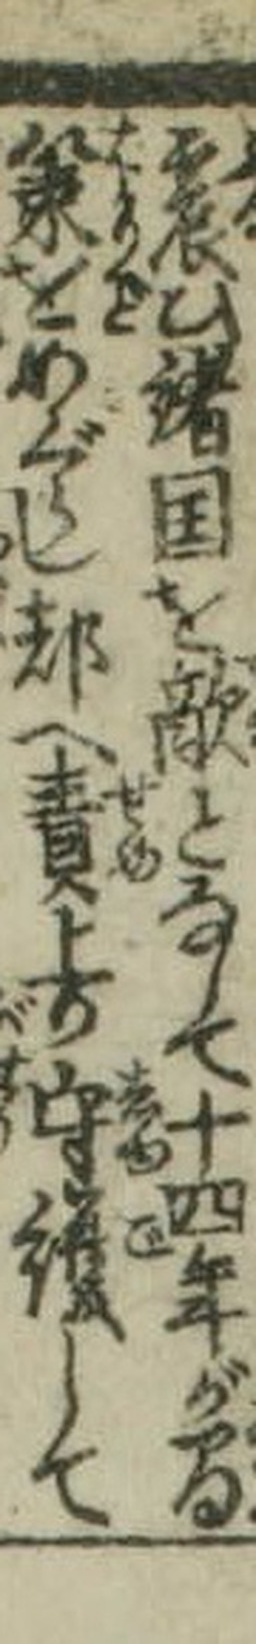策をめぐらし都へ責上り守護して
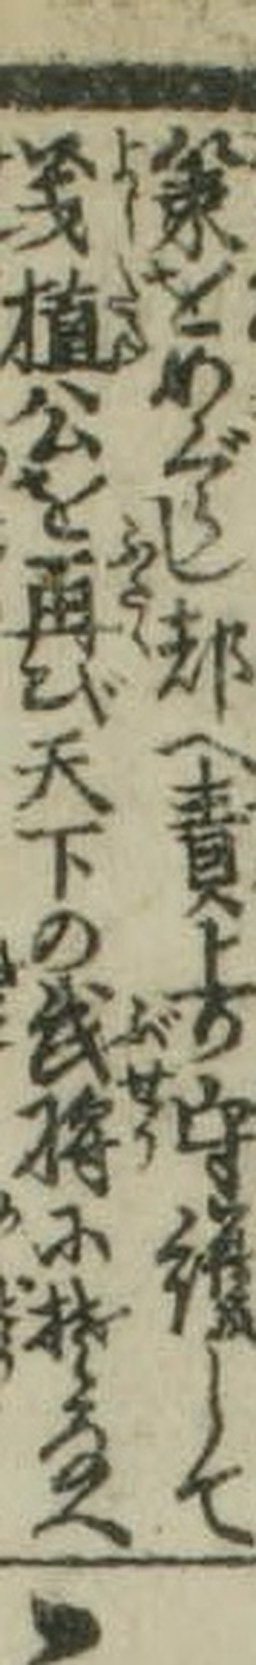義植公を再び天下の武将にそなへ
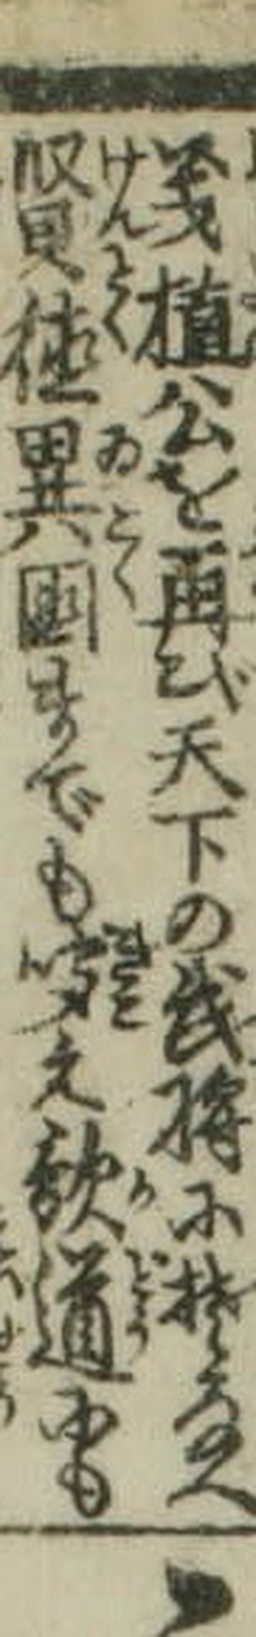賢徳異国までも聞え歌道にも
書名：續英雄百人一首
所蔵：東京学芸大学附属図書館
